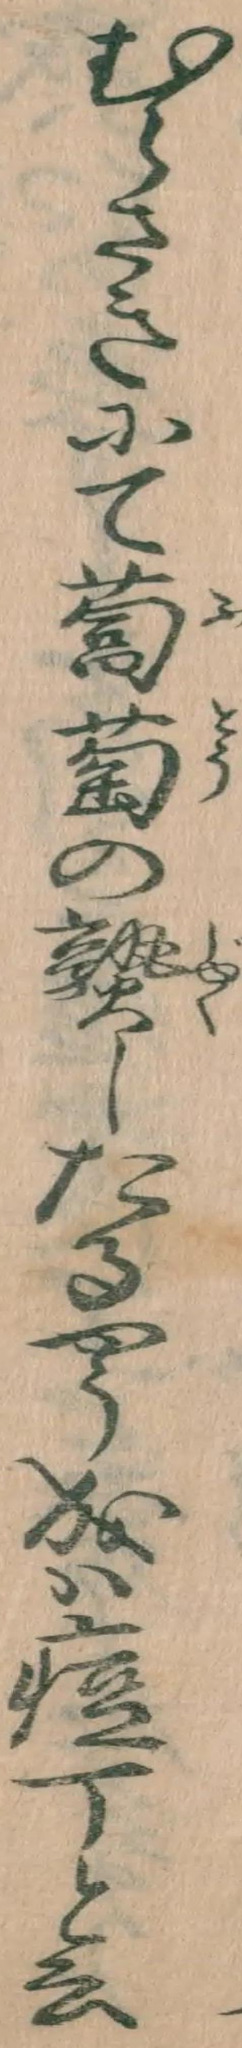むらさきにて蒲萄の熟したるやう成は痘丁と云

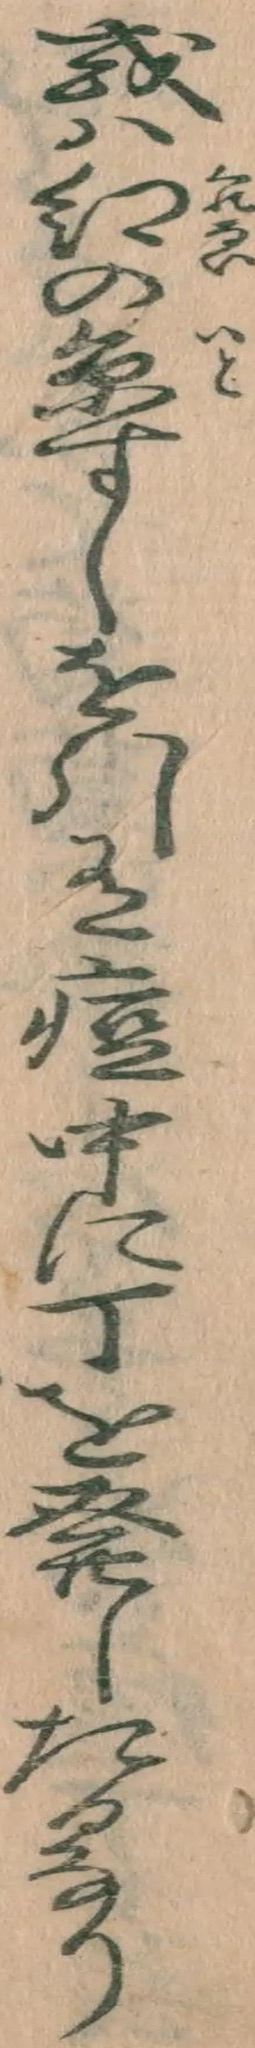或は紅の糸すしを引有痘中に丁を発したるなり
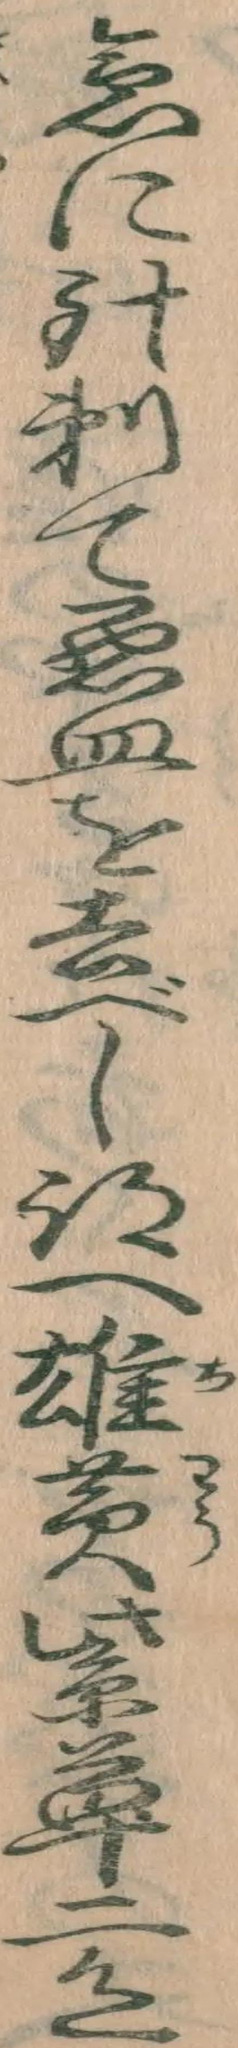急に針刺て悪血を去べし跡へ雄黄紫草二色
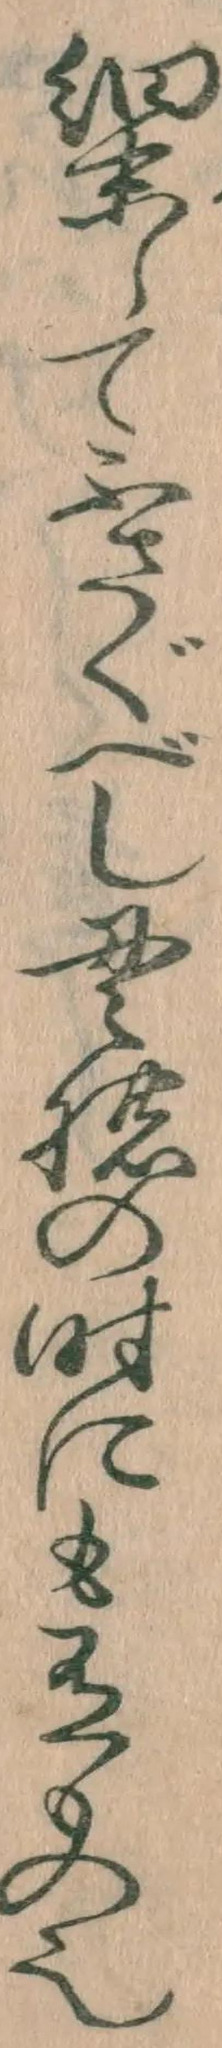細末してふさぐべし貫膿の時にも有もの也
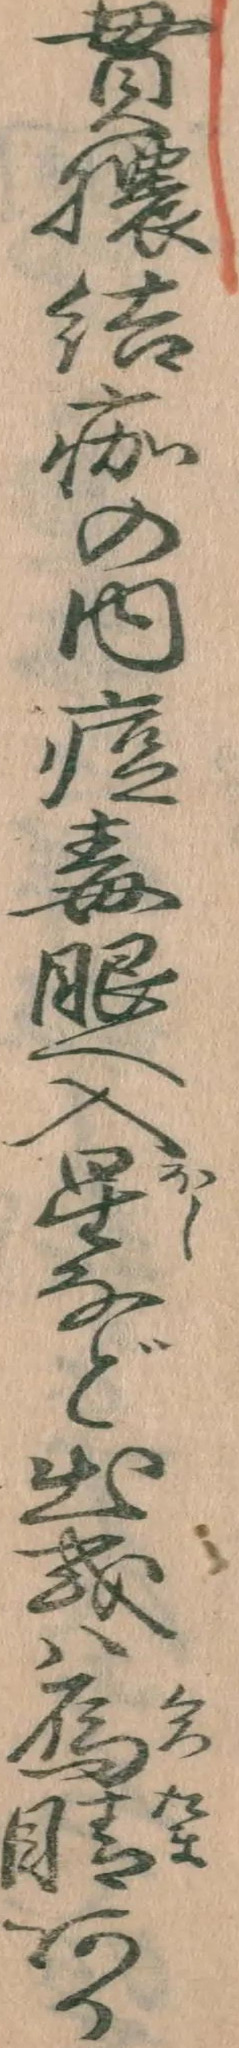貫膿結痂の内痘毒眼へ入星など出或は烏睛あか
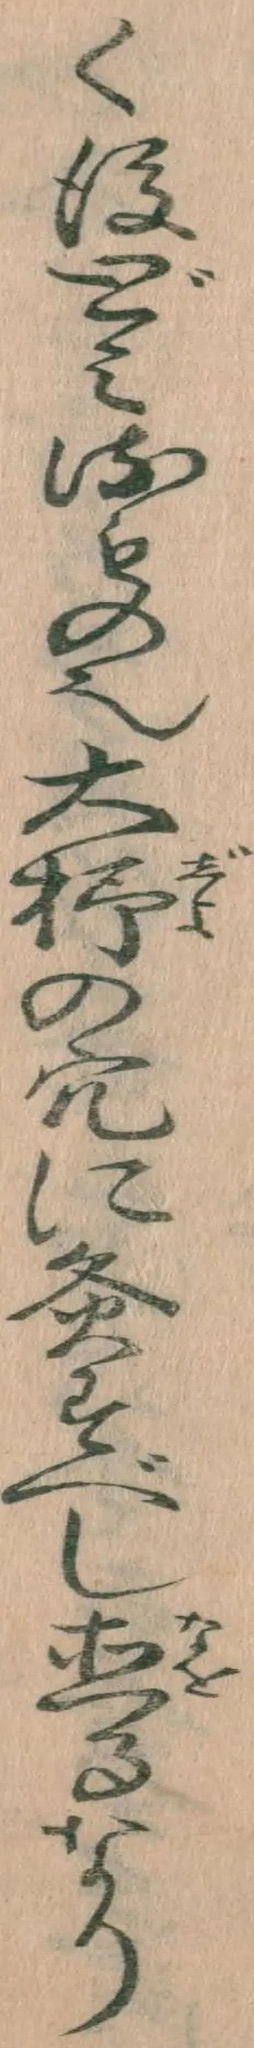く後どみるもの也大杼の穴に灸すべし直るなり
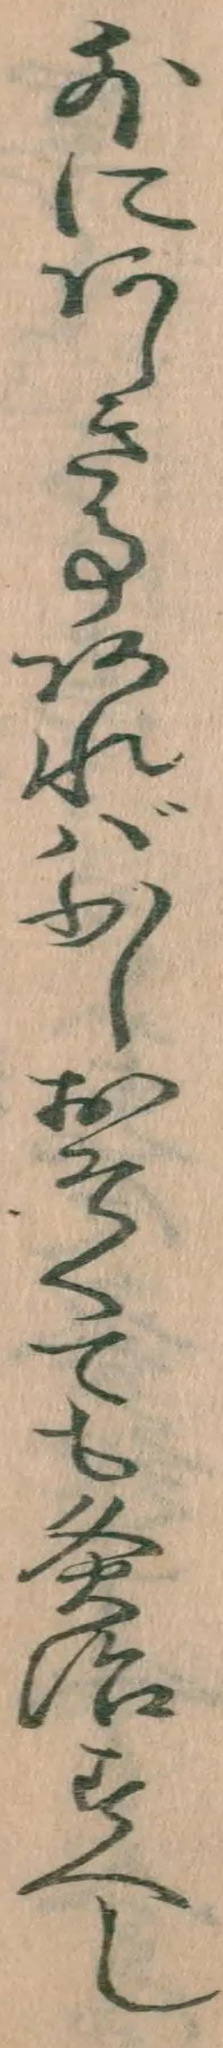外にあしき事あれば少しおそくても灸治すへし
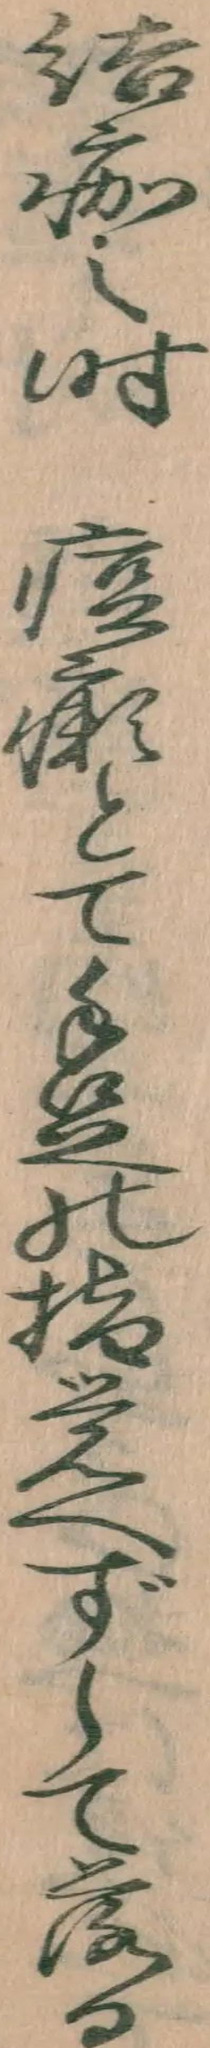結痂之時痘癩とて手足の指覚へずして落る
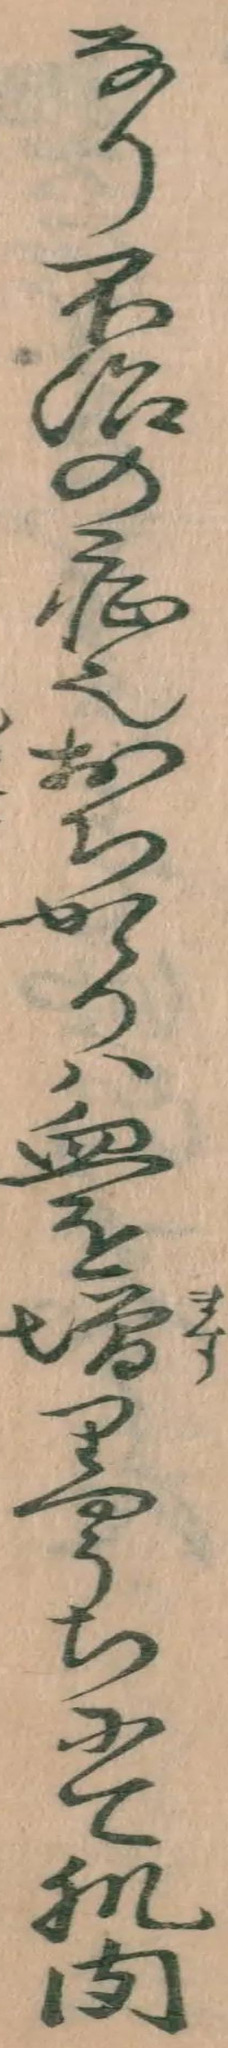なり不治の症也おちかゝりは血を増りやうちにて肌肉
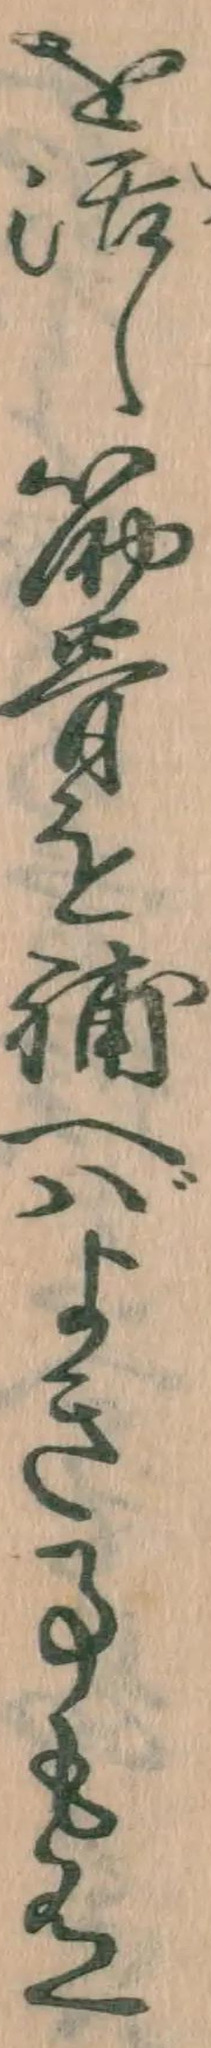を活し筋骨を補へばよき事も有
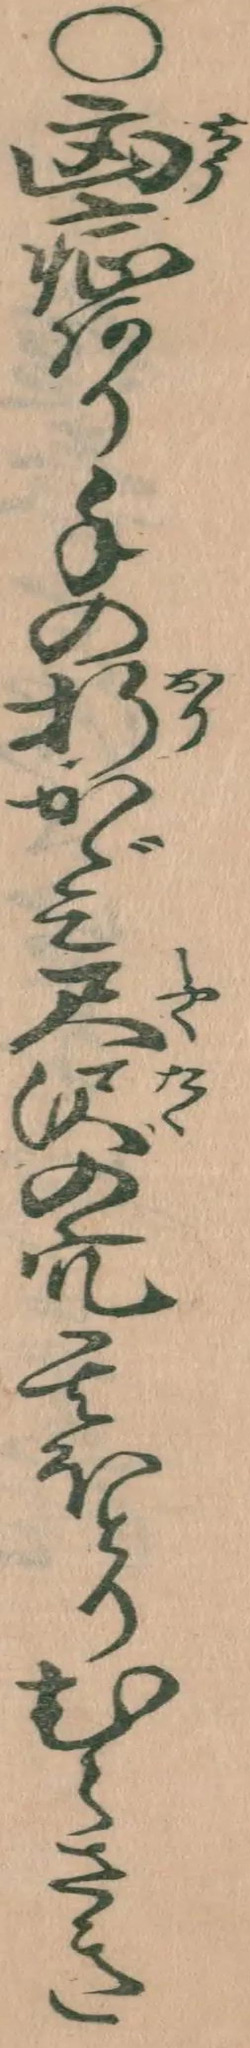○凶症あり手の折かゞみ尺沢の穴其ほとりむらさき
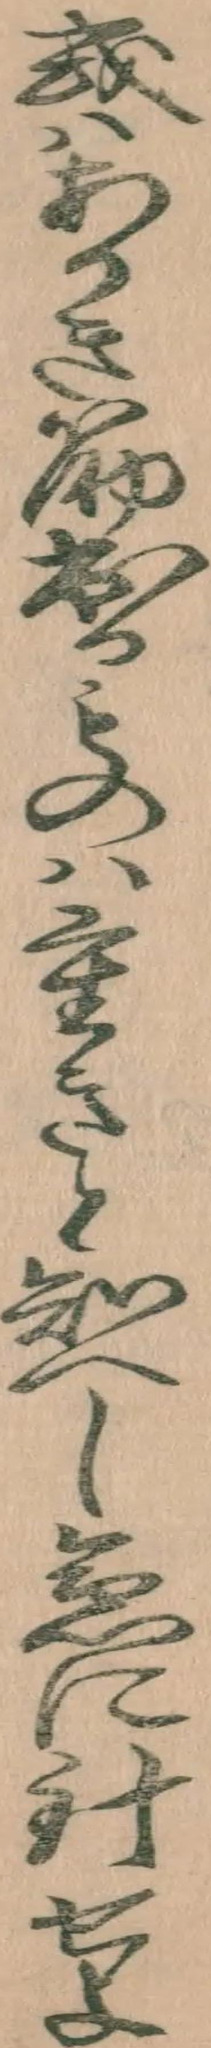或はあかき筋出るものは重きと知へし急に針せよ
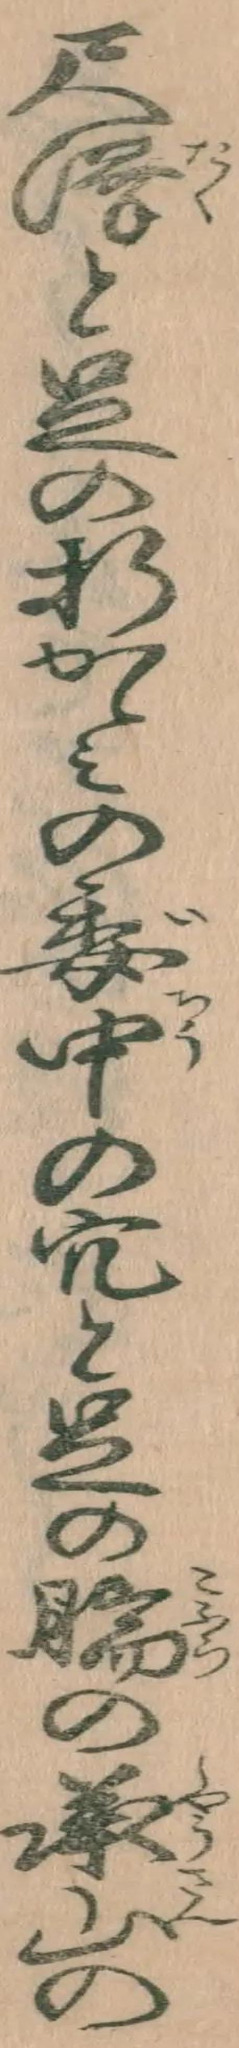尺沢と是の折かゝみの委中の穴と足の腨の承山の
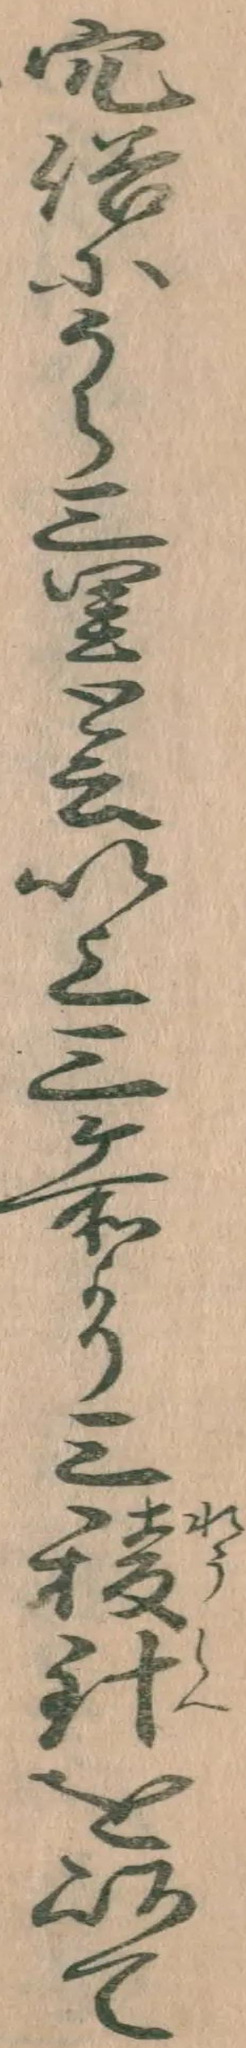穴俗にうら三里と云以上三ヶ所より三稜針を以て
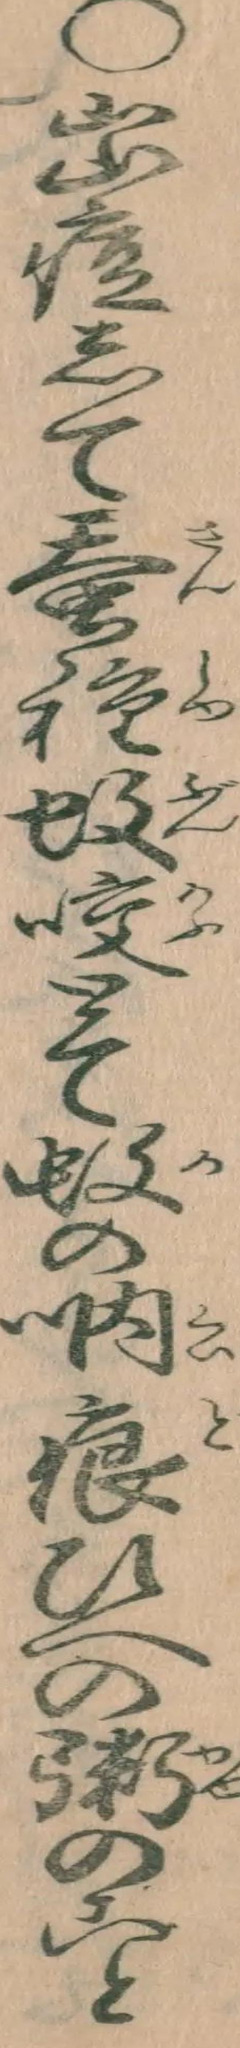○出痘して蚕種蚊咬とて蚊の吶痕ひへの粥のこと
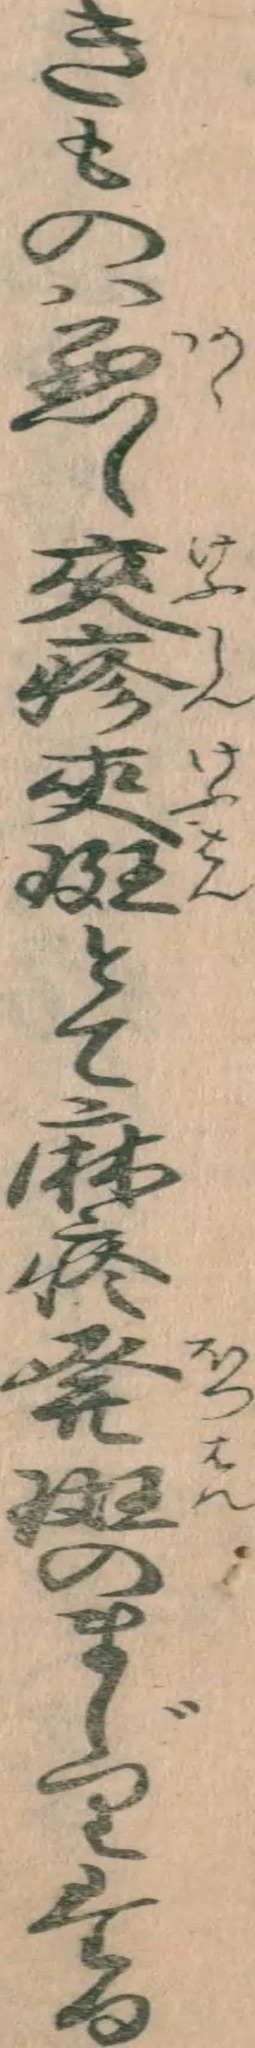きものは悪し夾疹夾斑とて麻疹発斑のまじりたる
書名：痘家初心問答
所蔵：国立国会図書館 National Diet Library, JAPAN
